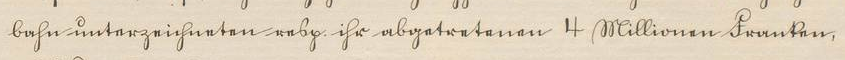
bahn unterzeichneten resp. ihr abgetretenen 4 Millionen Franken,
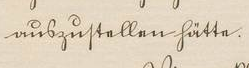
auszustellen hätte.
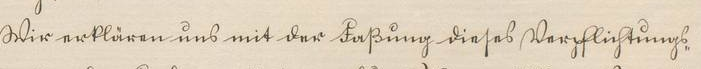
Wir erklären uns mit der Faßung dieses Verpflichtungs-
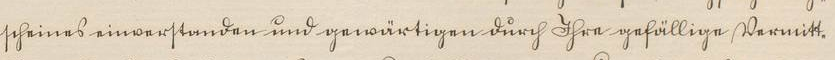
scheines einverstanden und gewärtigen durch Ihre gefällige Vermitt-
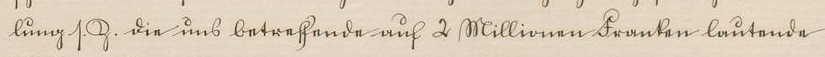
lung s. Z. die uns betreffende auf 2 Millionen Franken lautende
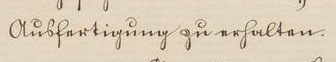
Ausfertigung zu erhalten.
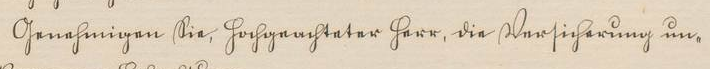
Genehmigen Sie, Hochgeachteter Herr, die Versicherung un-
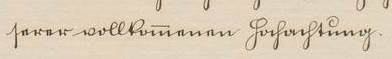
serer vollkommenen Hochachtung.
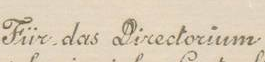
Für das Directorium
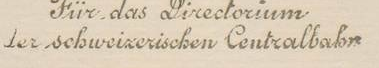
der schweizerischen Centralbahn
